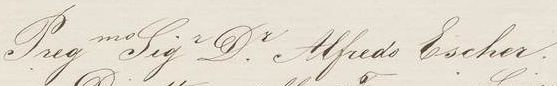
Pregmo Sigr Dr Alfredo Escher.
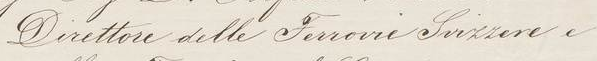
Direttore delle Ferrovie Svizzere e
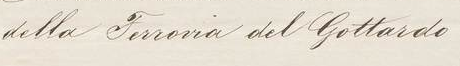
della Ferrovia del Gottardo
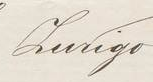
Zurigo
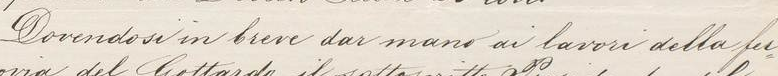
Dovendosi in breve dar mano ai lavori della fer-
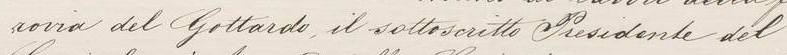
rovia del Gottardo, il sottoscritto Presidente del
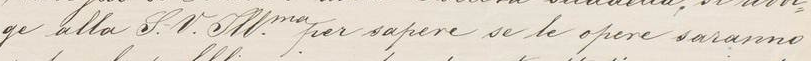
ge alla S. V. Illma per sapere se le opere saranno
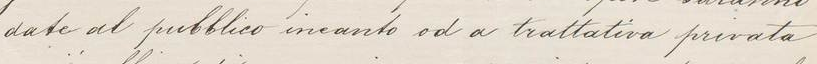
date al pubblico incanto od a trattativa privata
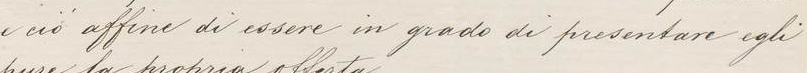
e ciò affine di essere in grado di presentare egli
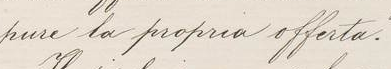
pure la propria offerta.
